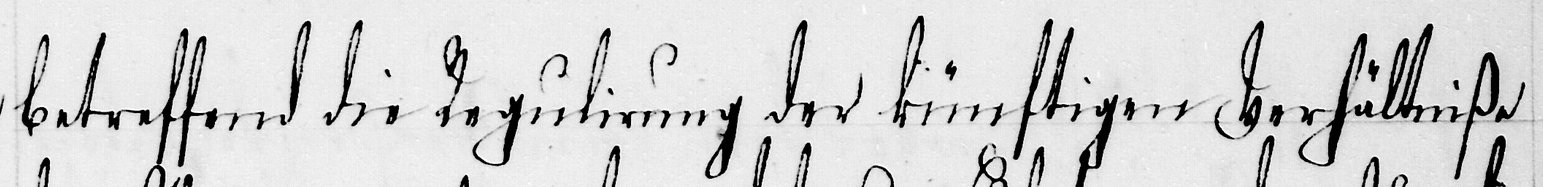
betreffend die Regulirung der künftigen Verhältniße
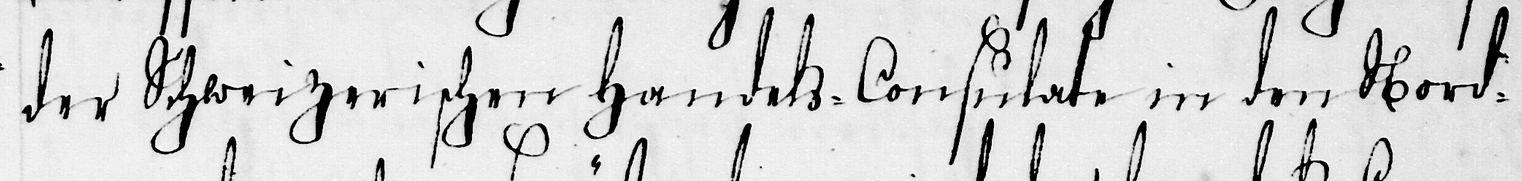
der Schweizerischen Handels-Consulate in den Nord¬
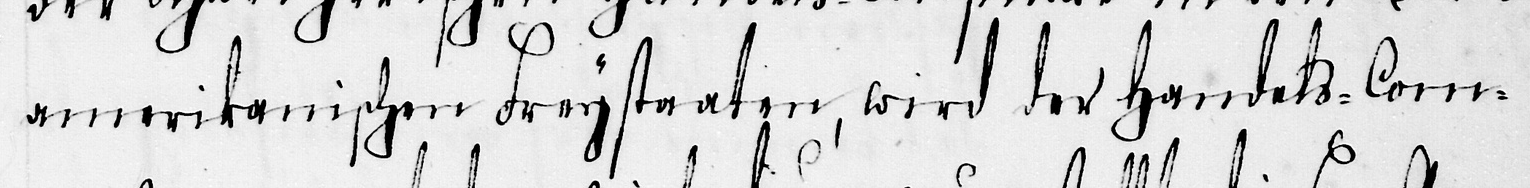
amerikanischen Freystaaten, wird der Handels-Com¬
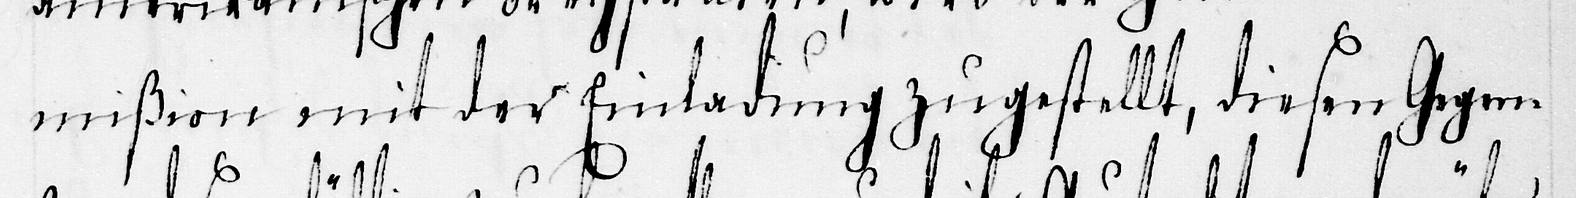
mißion mit der Einladung zugestellt, diesen Gegen¬
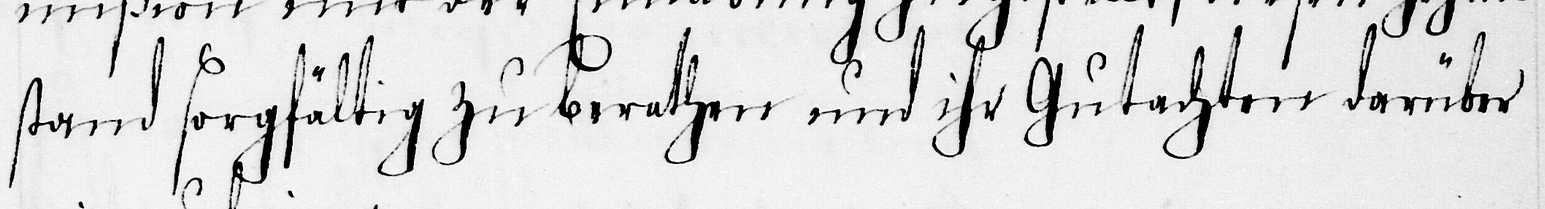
stand sorgfältig zu berathen und ihr Gutachten darüber
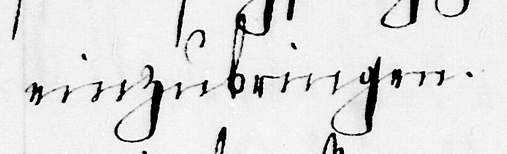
einzubringen.
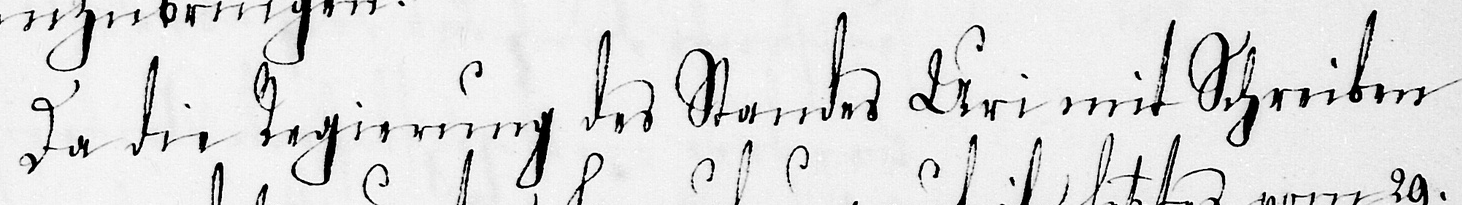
Da die Regierung des Standes Uri mit Schreiben
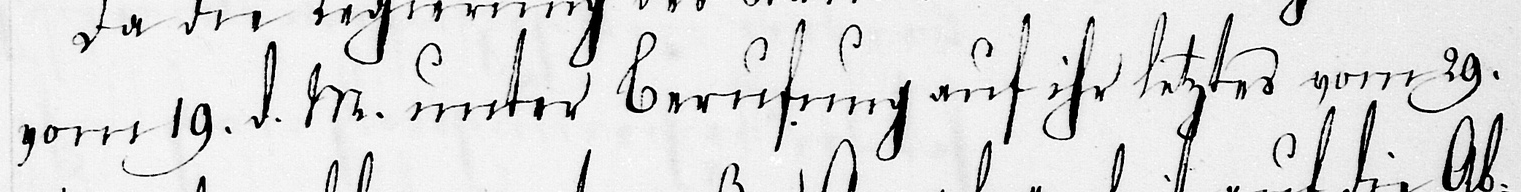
vom 19. d. M. unter Berufung auf ihr letztes vom 29.
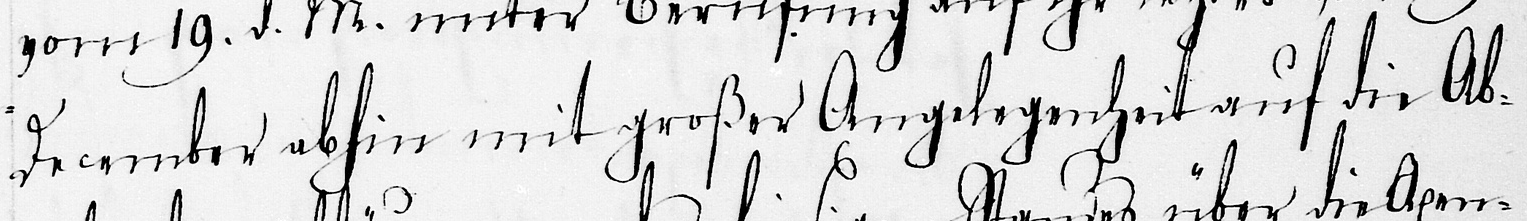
December abhin mit großer Angelegenheit auf die Ab¬
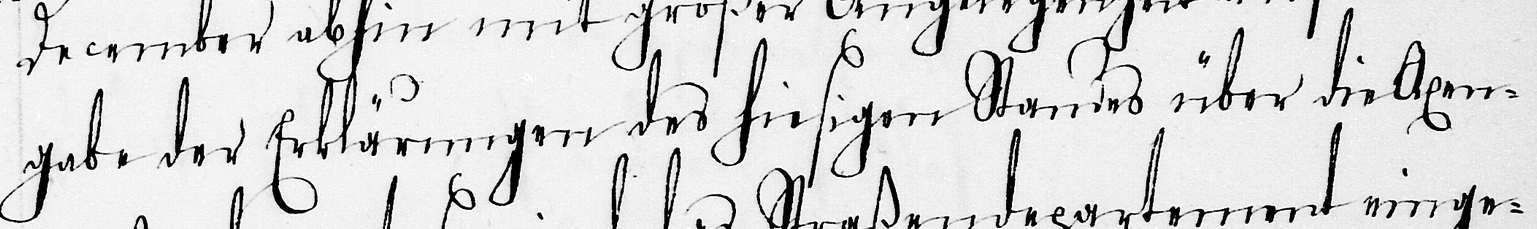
gabe der Erklärungen des hiesigen Standes über die Axen¬
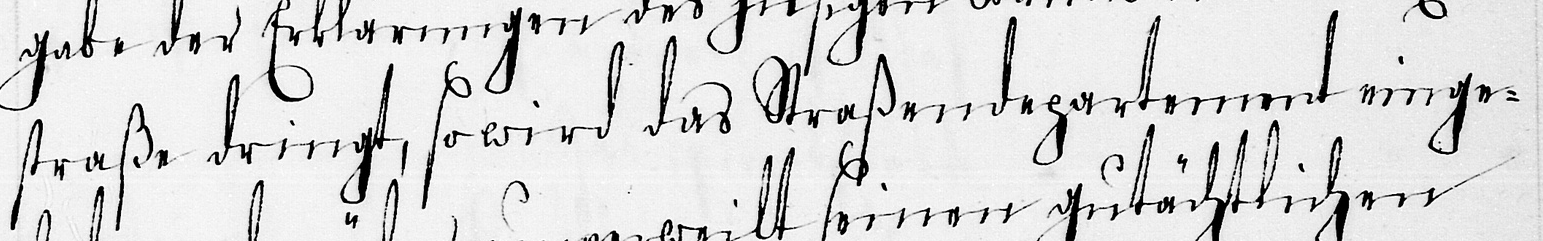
straße dringt, so wird das Straßendepartement einge¬
